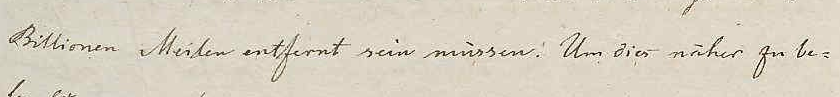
Billionen Meilen entfernt sein müssen. Um dies näher zu be-
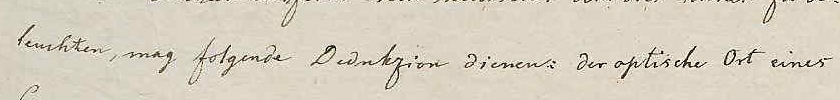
leuchten, mag folgende Dedukzion dienen: der optische Ort eines
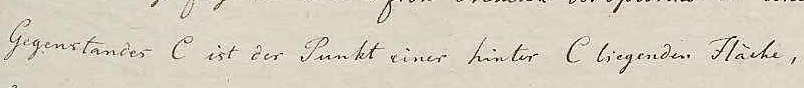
Gegenstandes C ist der Punkt einer hinter C liegende Fläche,
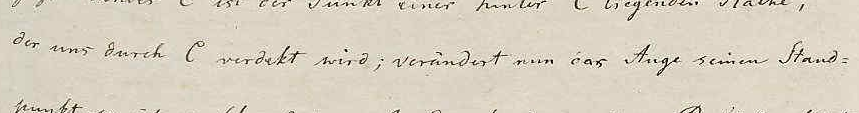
der uns durch C verdekt wird; verändert nun das Auge seinen Stand-
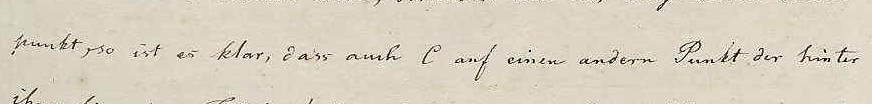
punkt, so ist es klar, dass auch C auf einen andern Punkt der hinter
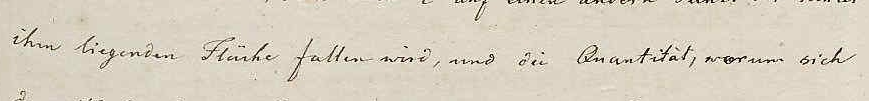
ihm liegenden Fläche fallen wird, und die Quantität, warum sich
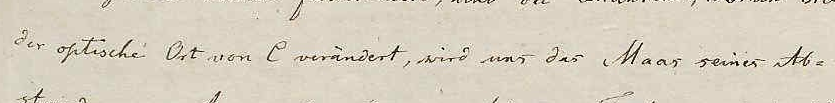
der optische Ort von C verändert, wird uns das Maas seines Ab-
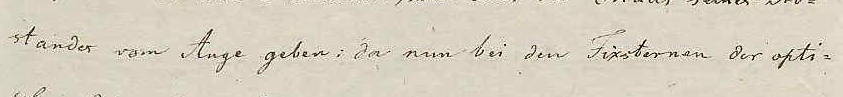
standes vom Auge geben: da nun bei den Fixsternen der opti-
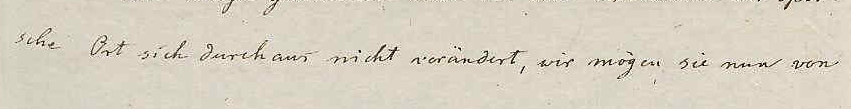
sche Ort sich durchaus nicht verändert, wir mögen sie nun
